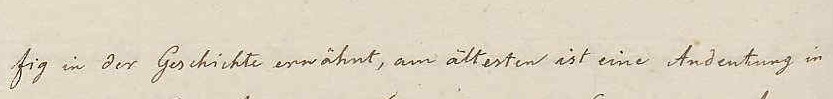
fig in der Geschichte erwähnt, am ältesten ist eine Andeutung in
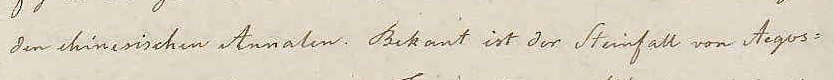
den chinesischen Annalen. Bekant ist der Steinfall von Aegos-
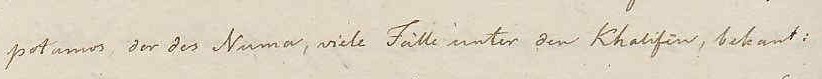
potamos, der des Numa, viele Fälle unter den Khalifen, bekant:
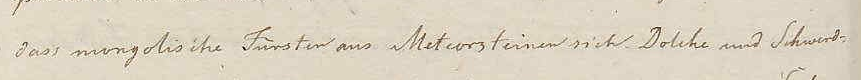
dass mongolische Fürsten aus Meteorsteinen sich Dolche und Schwerd-
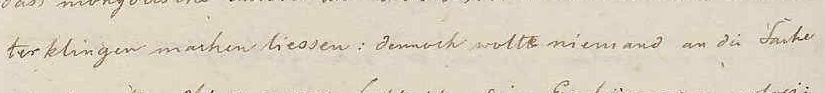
ter klingen machen liessen: dennoch wolte niemand an die Sache
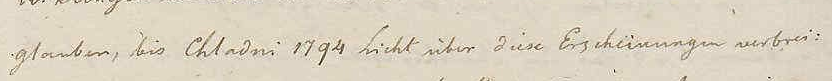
glauben, bis Chladni 1794 Licht über diese Erscheinungen verbrei-
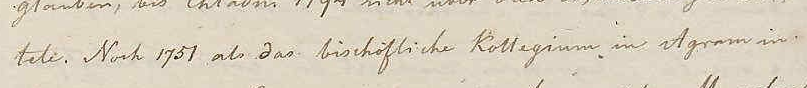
tete. Noch 1751 als das bischöfliche Kollegium in Agram in
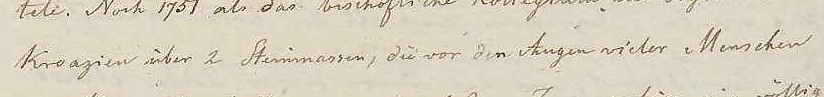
Kroazien über 2 Steinmassen, die vor den Augen vieler Menschen
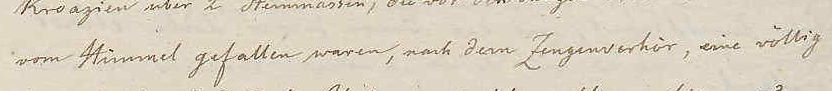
vom Himmel gefallen waren, nach dem Zeugenverhör, eine völlig
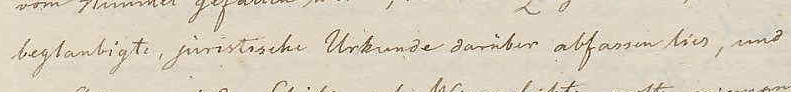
beglaubigte, juristische Urkunde darüber abfassen lies, und
